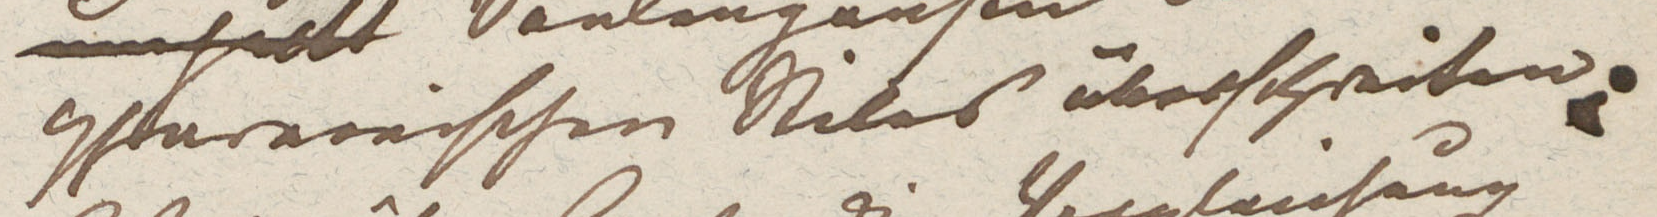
pharaonischen Stiles überschreiten;.
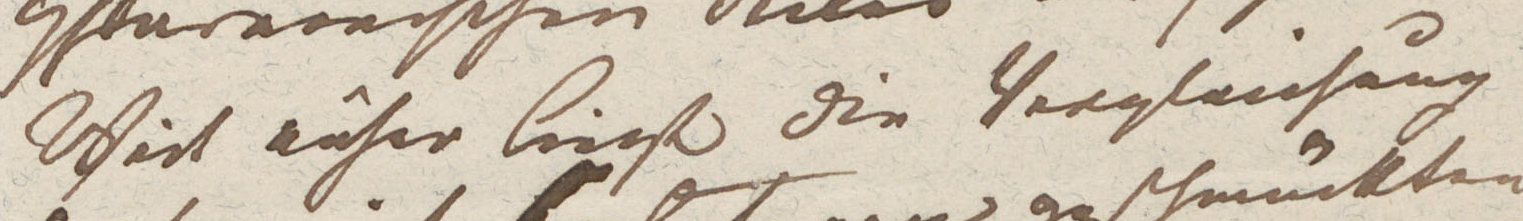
Weit näher liegt die Vergleichung
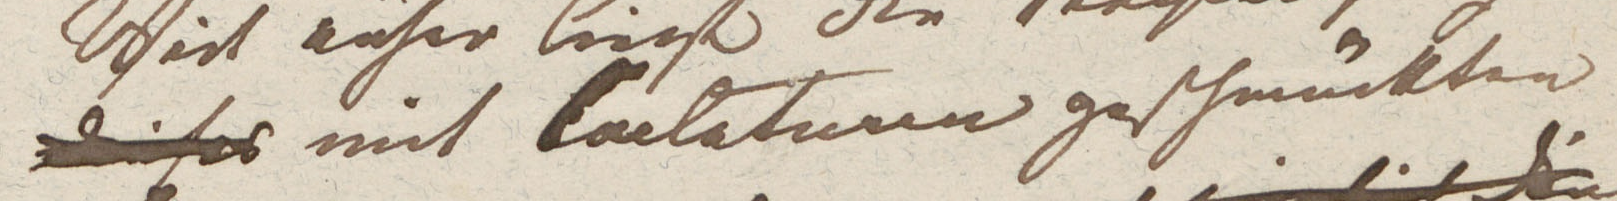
dieses mit Caelaturen geschmückten
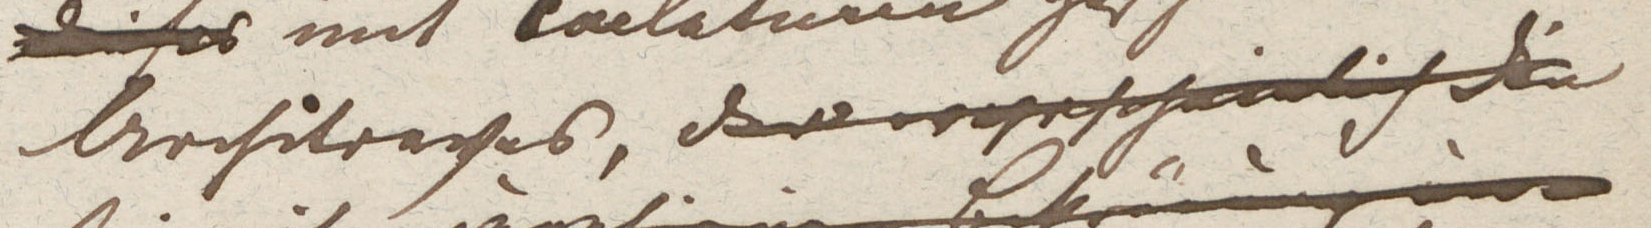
Architraves, der wahrscheinlich die
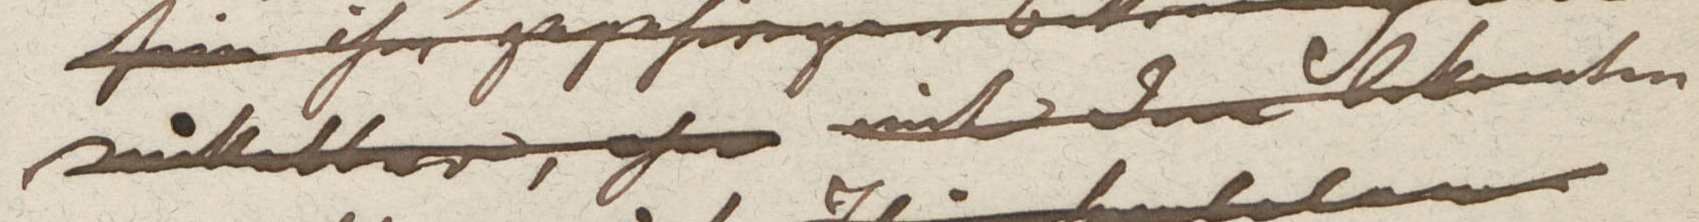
mittelbar, ihm mit den bekannten
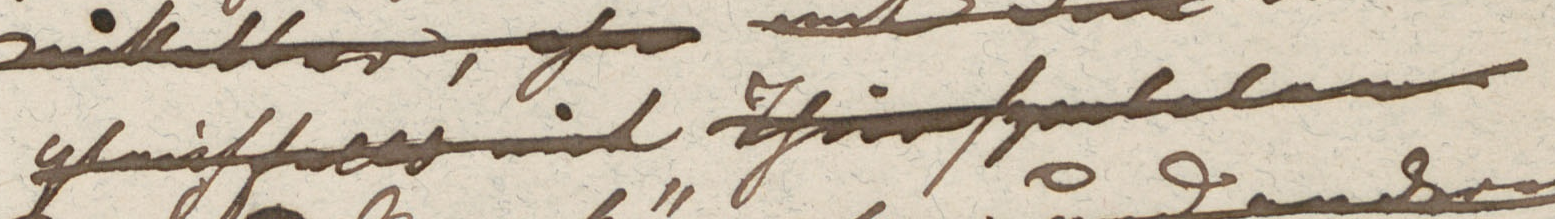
gleichfalls mit Thiersymbolen
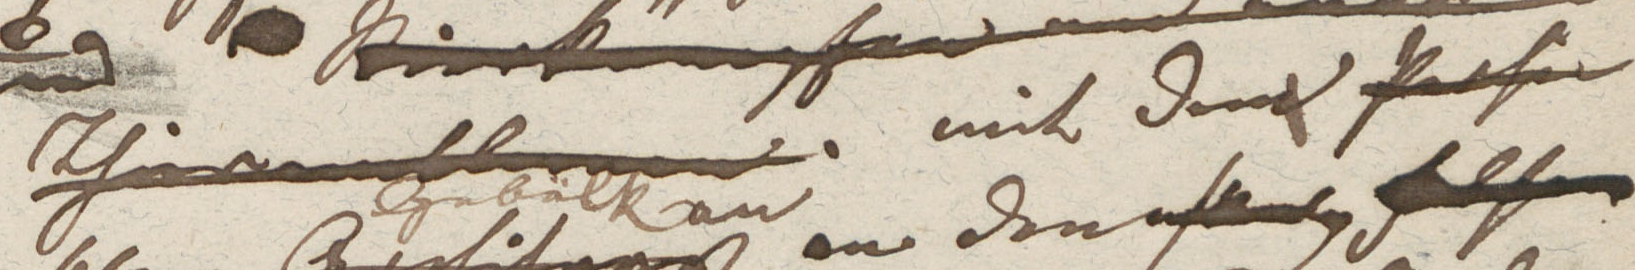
Thieremblemen mit demn Persi-
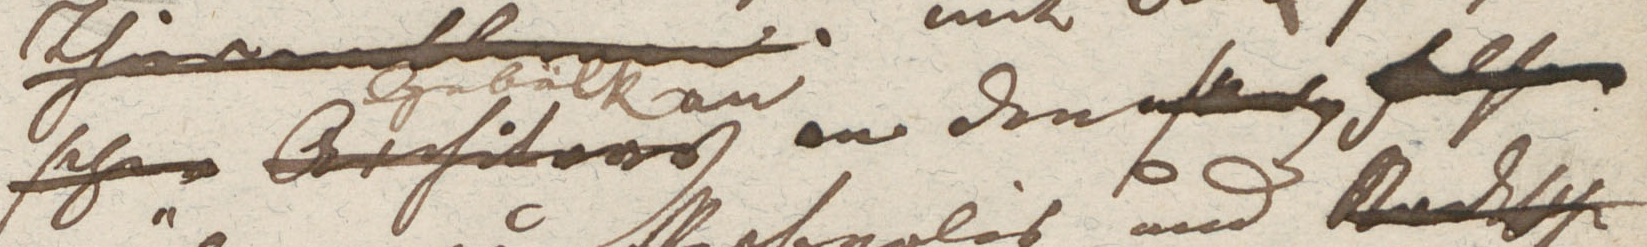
schen Architrav Gebälken an den Felsen
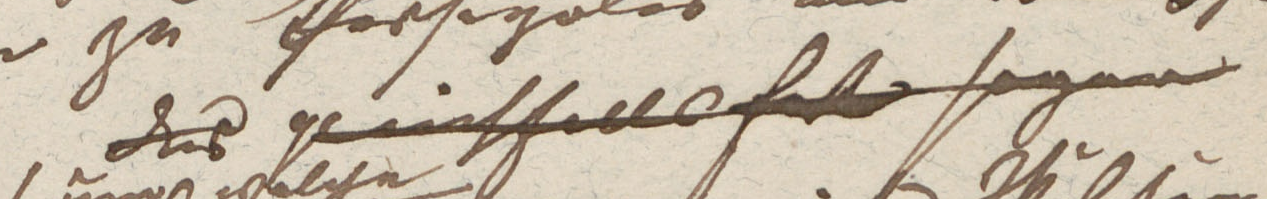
das gleichfalls hat sogar
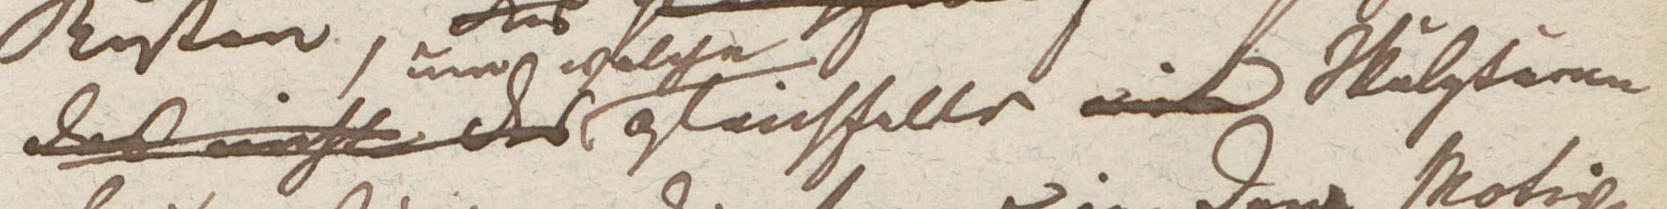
das nicht das um welche gleichfalls mit Skulpturen
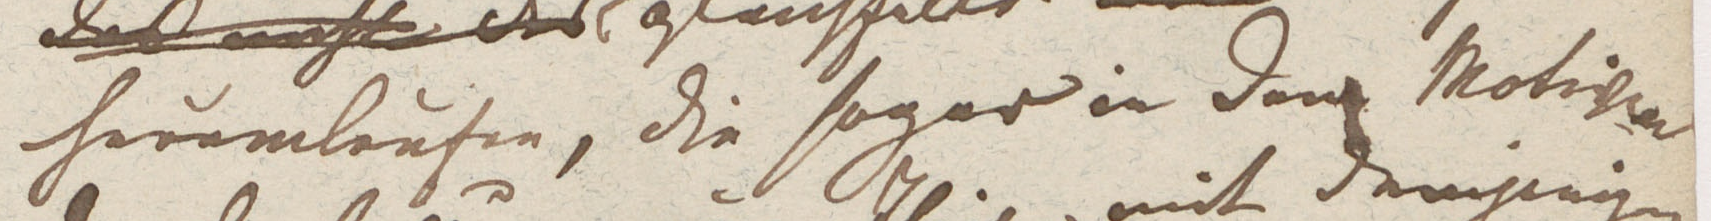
herumlaufen, die sogar in demn Motiven
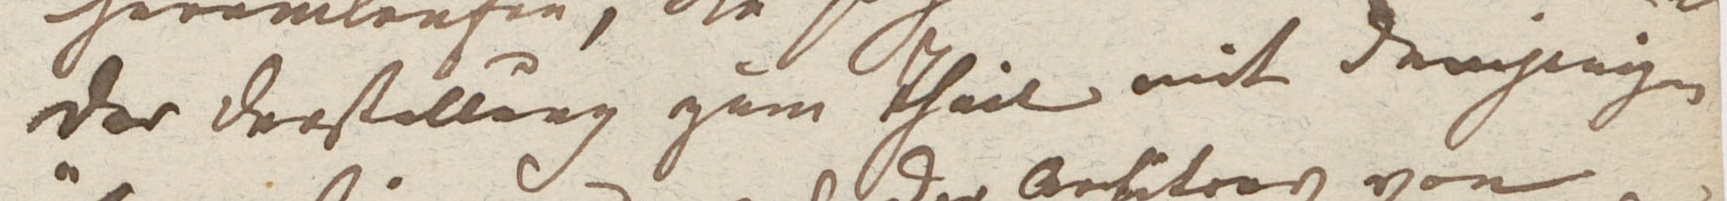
der Darstellung zum Theil mit demjenigen
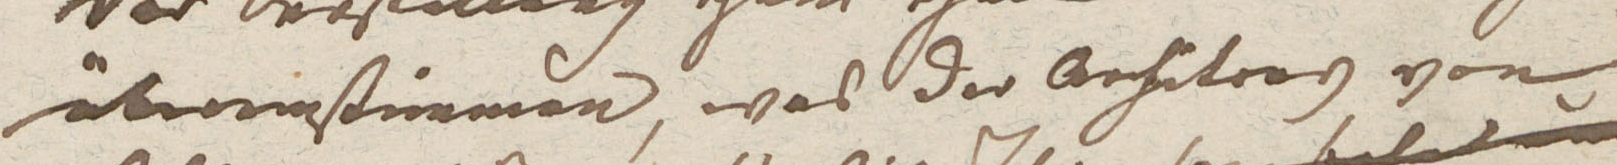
übereinstimmen, was der Architrav von
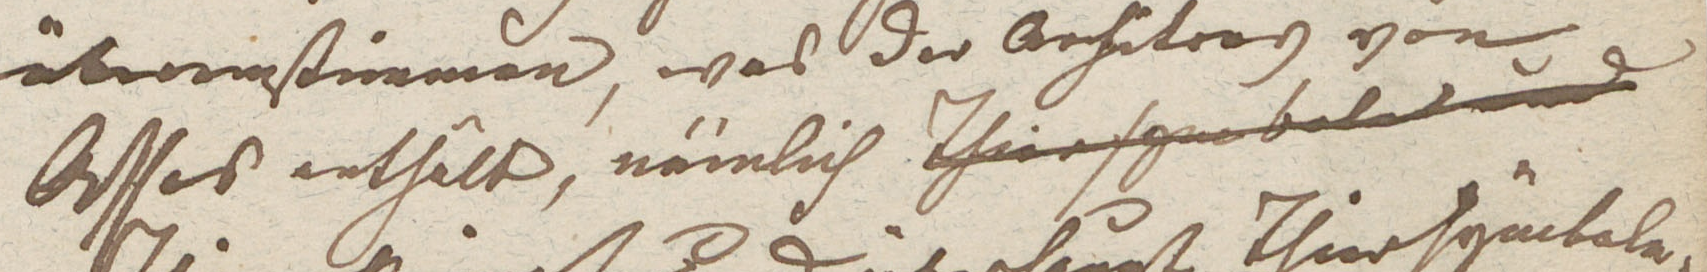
Assos enthält, nämlich Thiersymbole und
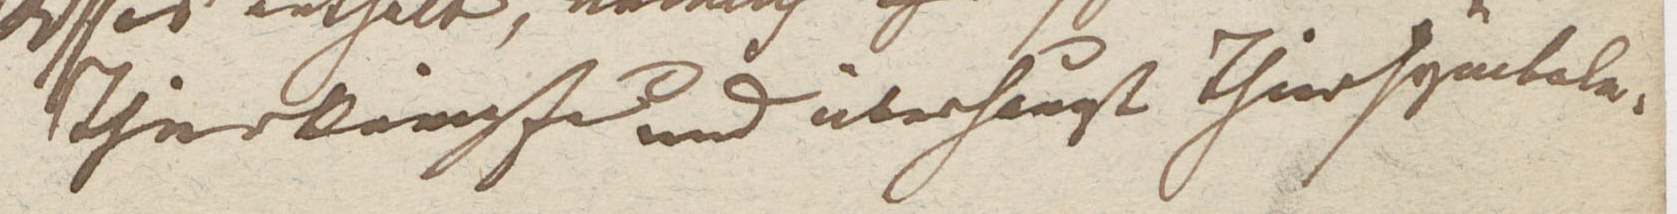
Thierkämpfe und überhaupt Thiersymbole.
